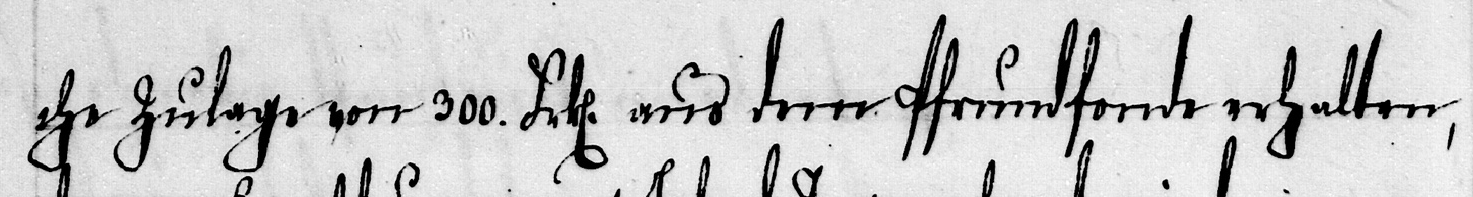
che Zulage von 300. Frk[en]. aus dem Pfrundfonde erhalten,
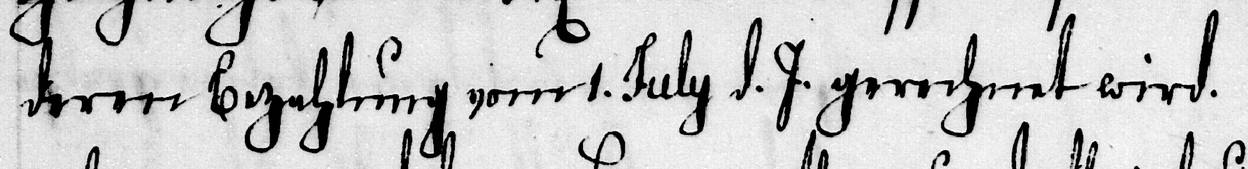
deren Bezahlung vom 1. July d. J. gerechnet wird.
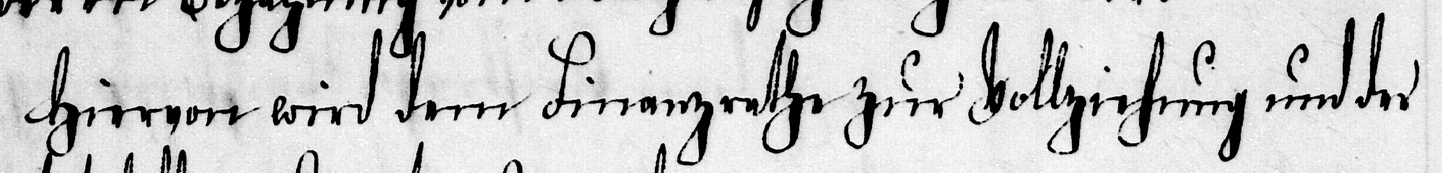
Hiervon wird dem Finanzrathe zur Vollziehung und der
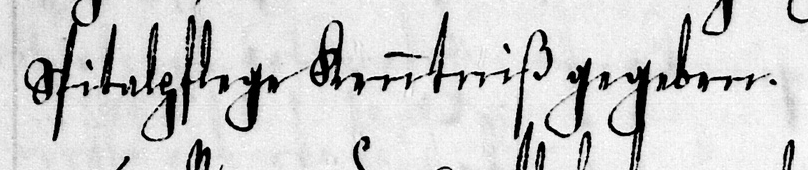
Spitalpflege Kenntniß gegeben.
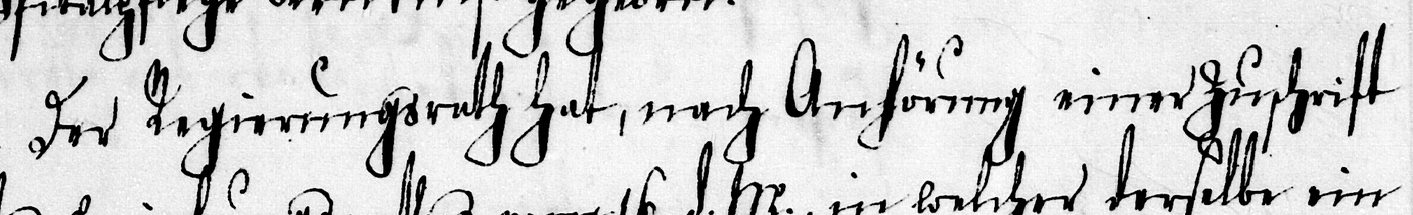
Der Regierungsrath hat, nach Anhörung einer Zuschrift
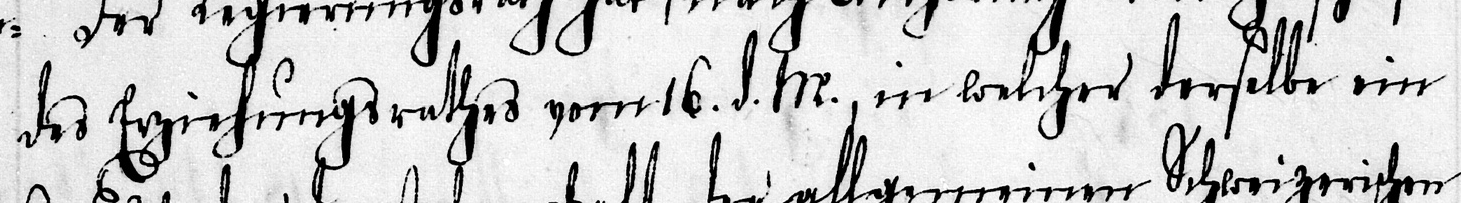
des Erziehungsrathes vom 16. d. M., in welcher derselbe ein
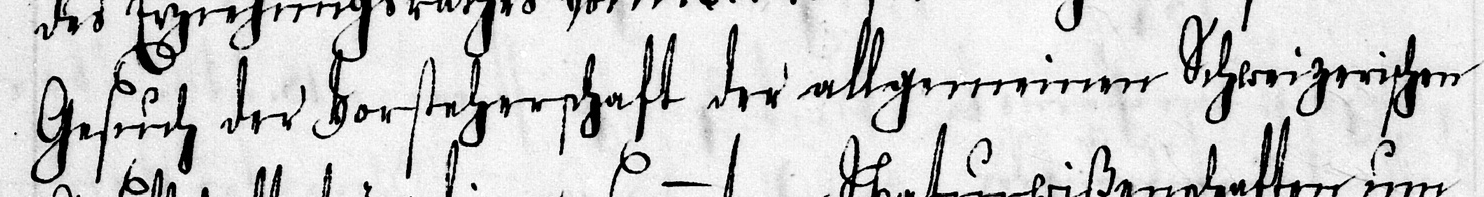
Gesuch der Vorsteherschaft der allgemeinen Schweizerischen
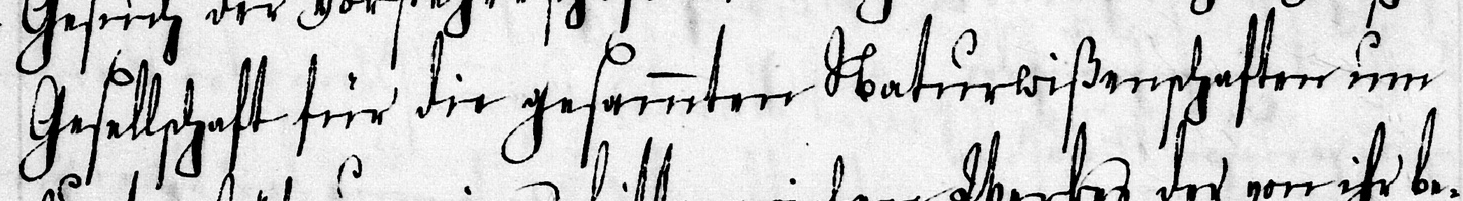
Gesellschaft für die gesammten Naturwißenschaften um
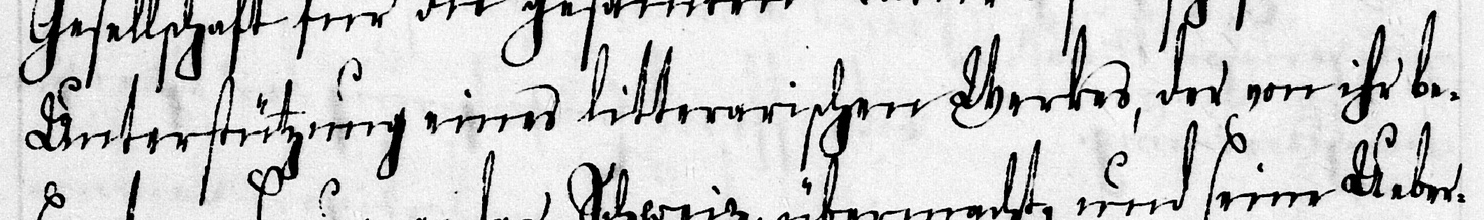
Unterstützung eines litterarischen Werkes, der von ihr be¬
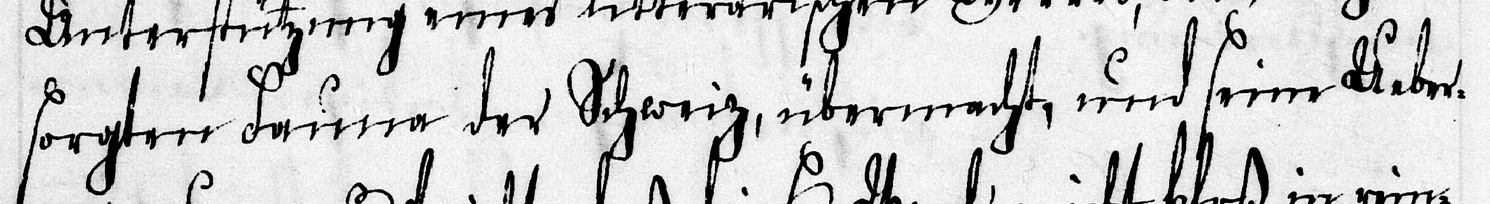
sorgten Fauna der Schweiz, übermacht, und seine Ueber¬
